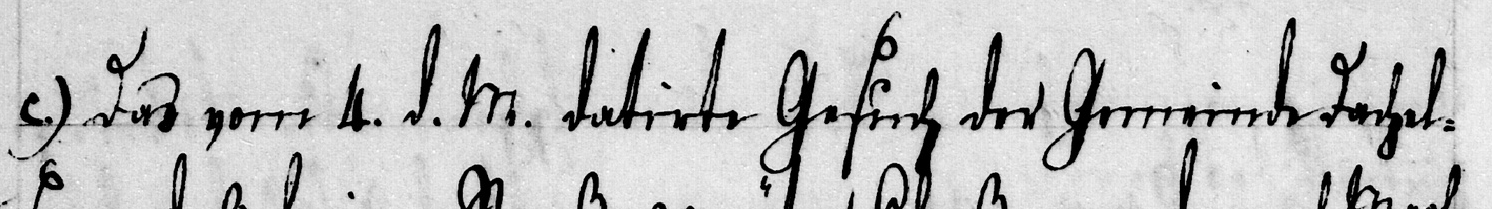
c.) Das vom 4. d. M. datirte Gesuch der Gemeinde Dachel¬
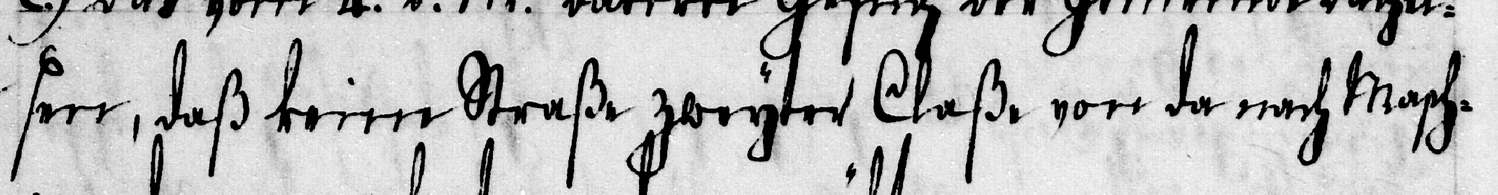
sen, daß keine Straße zweyter Claße von da nach Masch¬
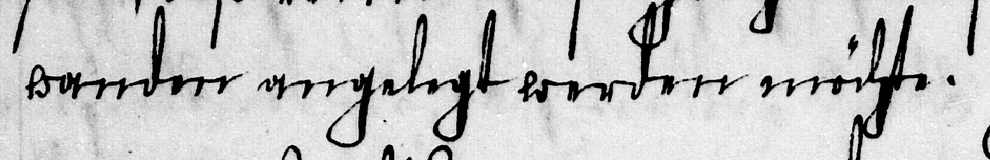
wanden angelegt werden möchte.
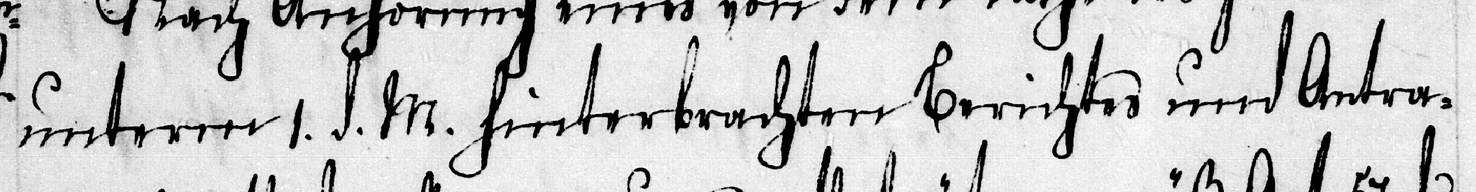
unterm 1. d. M. hinterbrachten Berichtes und Antra¬
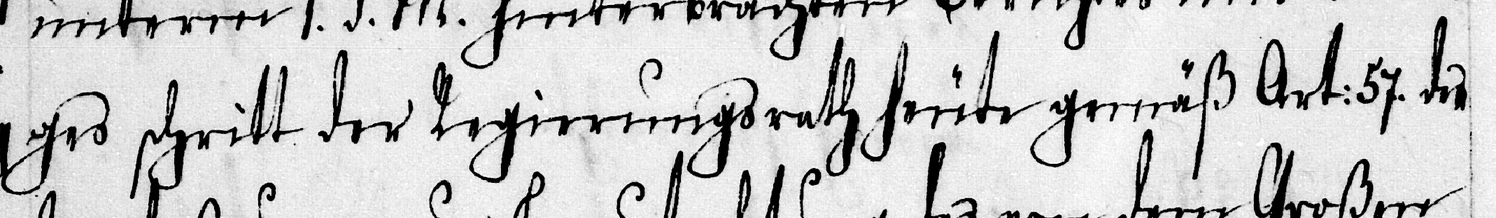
ges schritt der Regierungsrath heute gemäß Art: 57. der
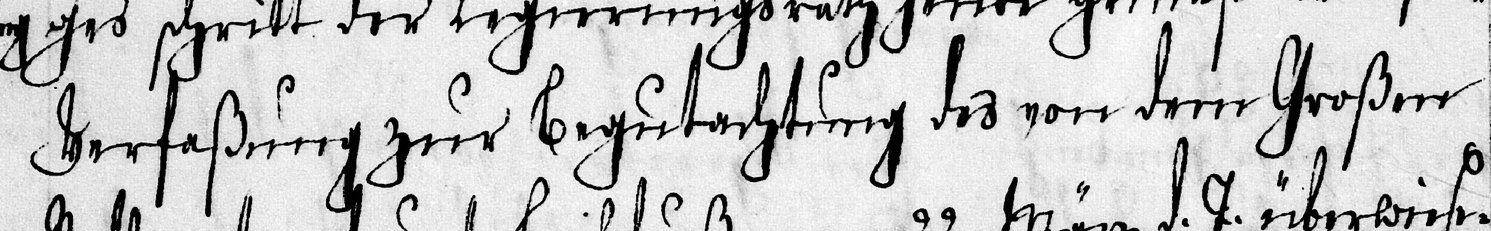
Verfaßung zur Begutachtung des von dem Großen
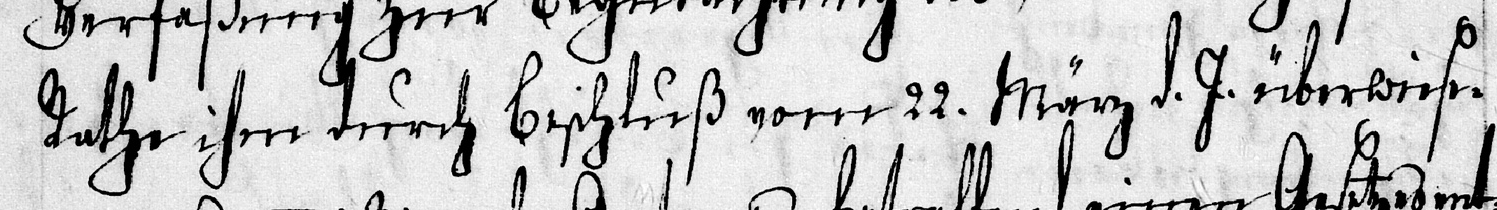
Rathe ihm durch Beschluß vom 22. März d. J. überwiese¬
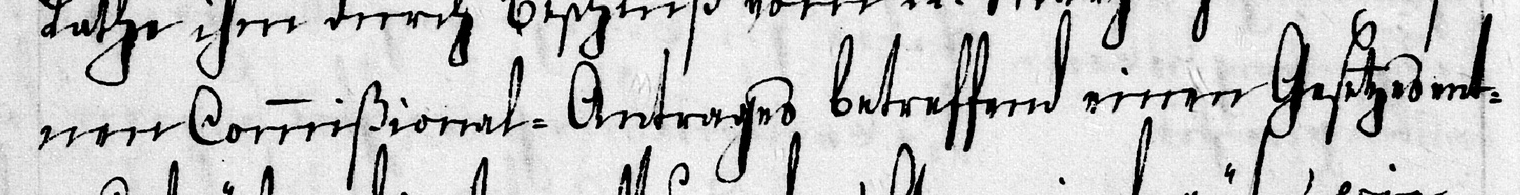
nen Commißional-Antrages betreffend einen Gesetzesent¬
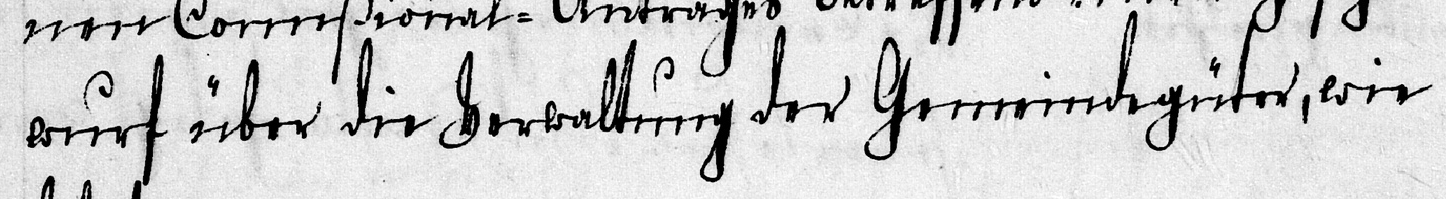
wurf über die Verwaltung der Gemeindegüter, wie
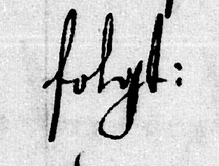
folgt:
